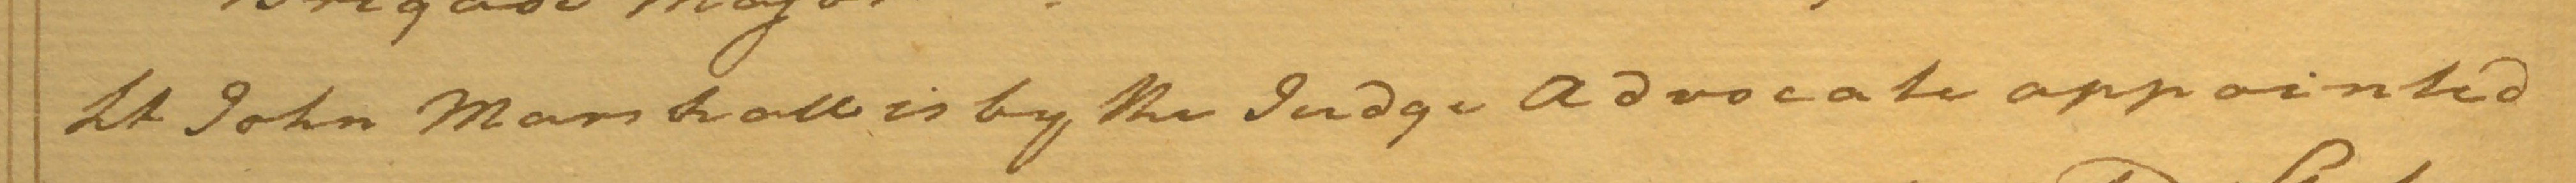Lt John Marshall is by the Judge Advocate appointed
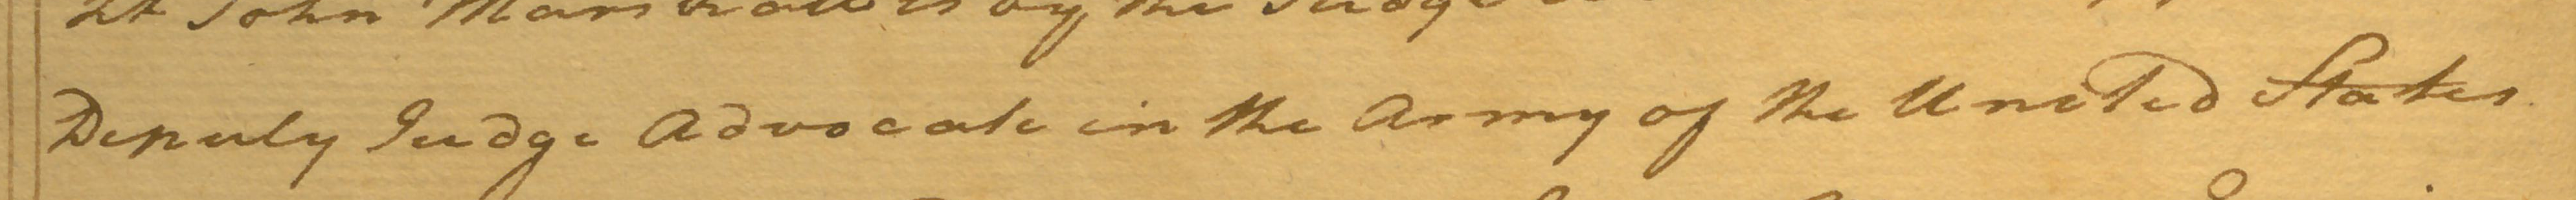Deputy Judge Advocate in the Army of the United States
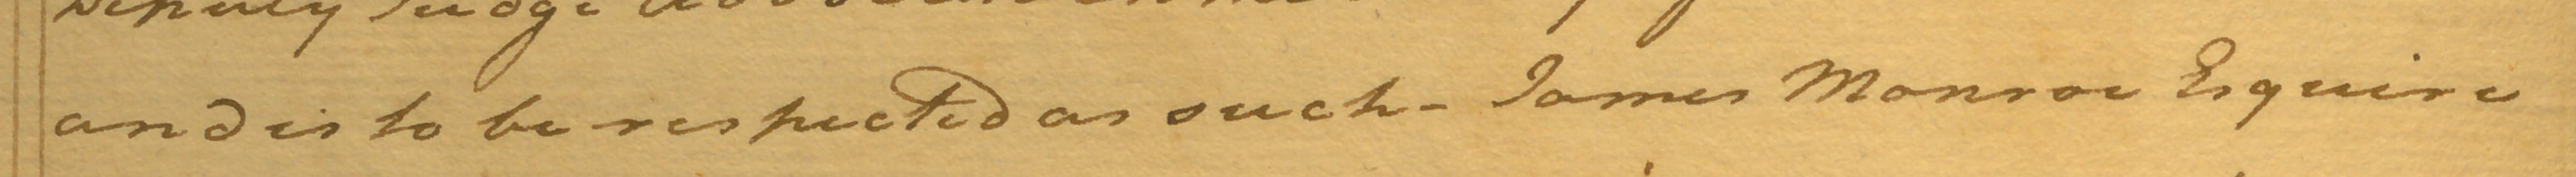and is to be respected as such- James Monroe Esquire
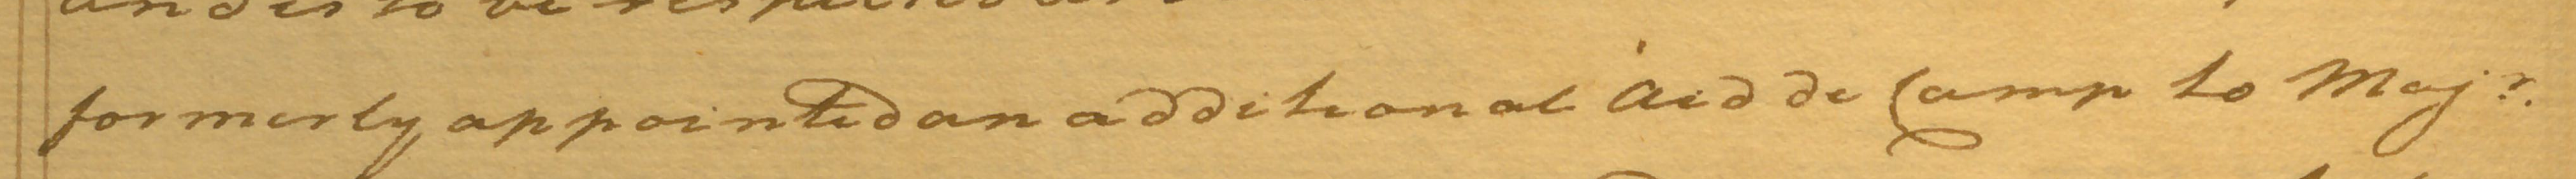formerly appointed an additional Aid de Camp to Maj^r.
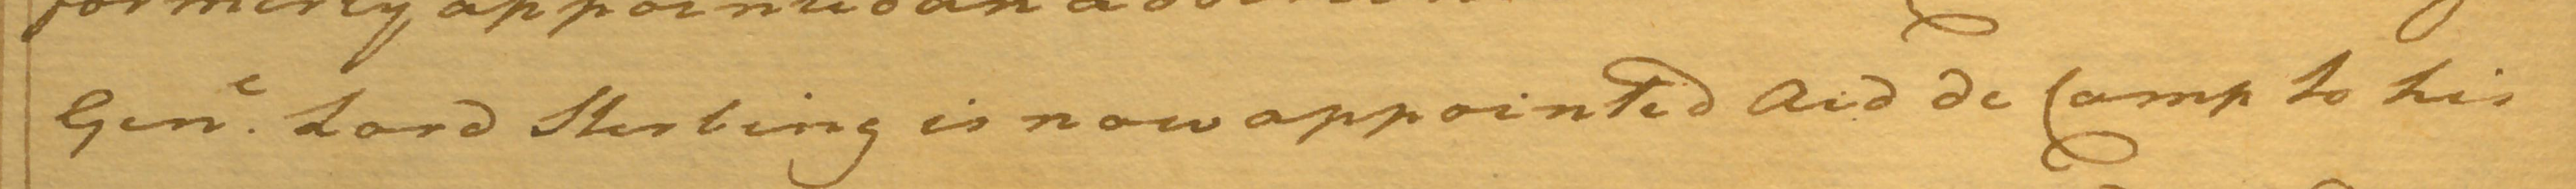Gen^l. Lord Sterling is now appointed Aid de Camp to his
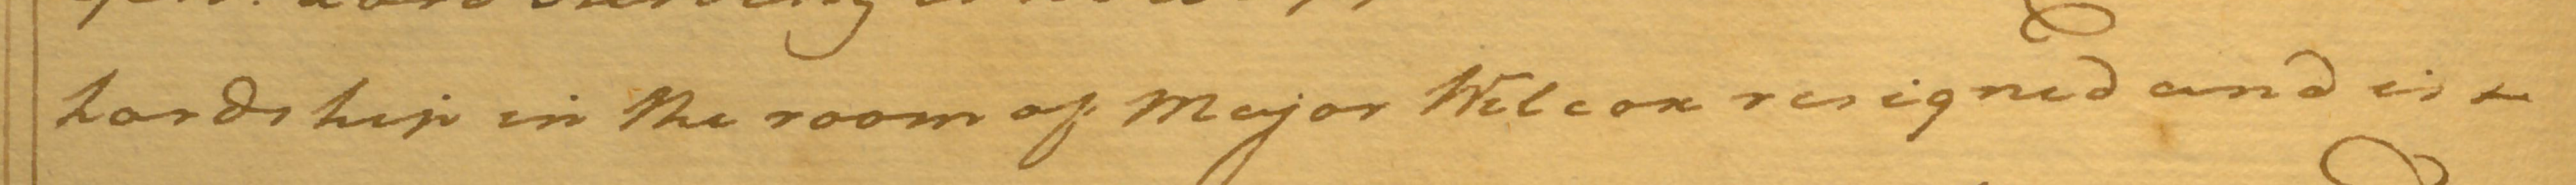Lordship in the room of Major Wilcox resigned and is
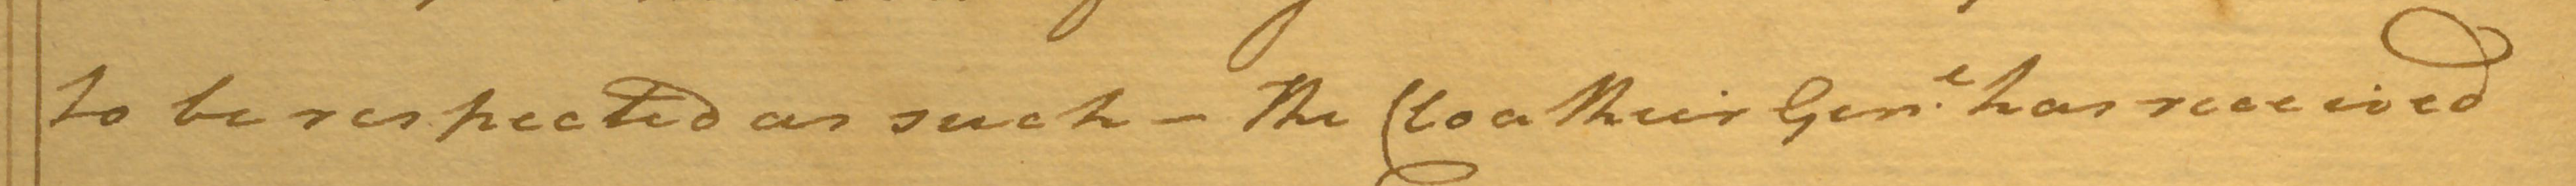to be respected as such- the Cloathier Gen^l. has received
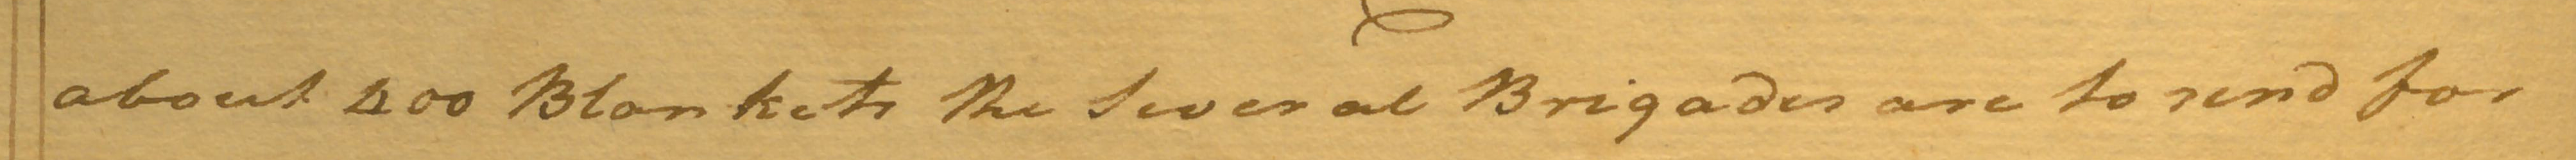about 400 Blankets the Several Brigades are to send for
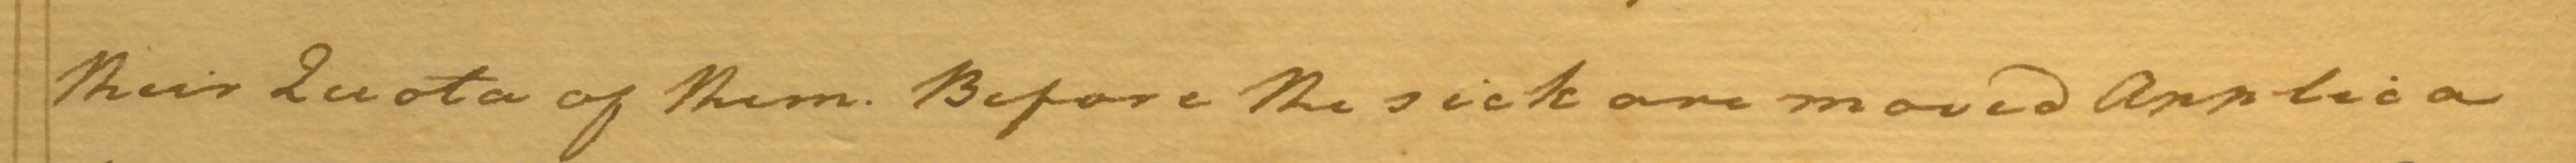their Quota of them. Before the sick are moved Applica
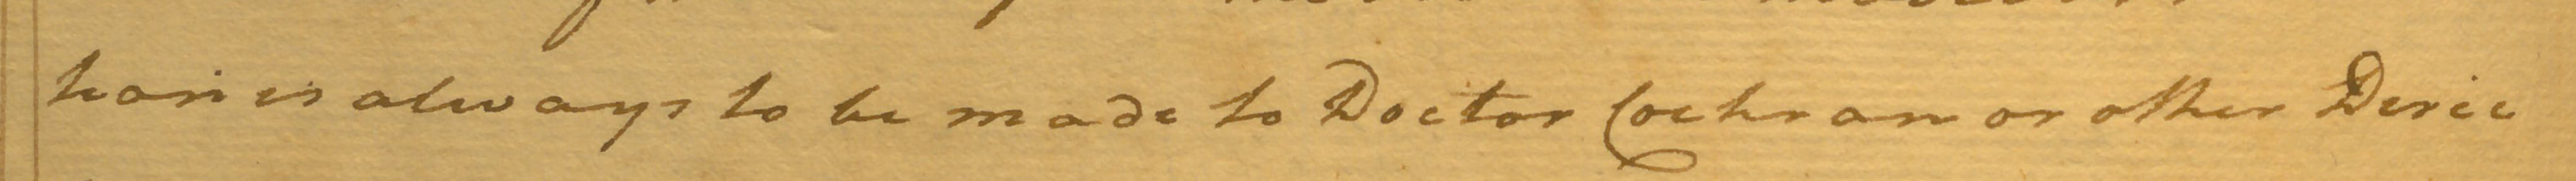tion is always to be made to Doctor Cochran or other Direc
